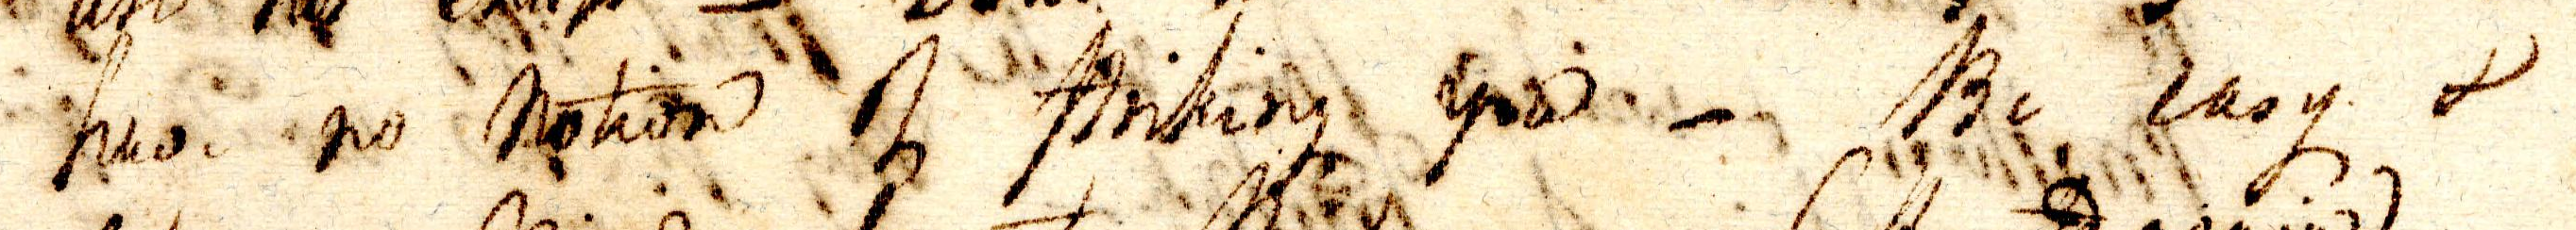have no notion of striking you- Be easy &
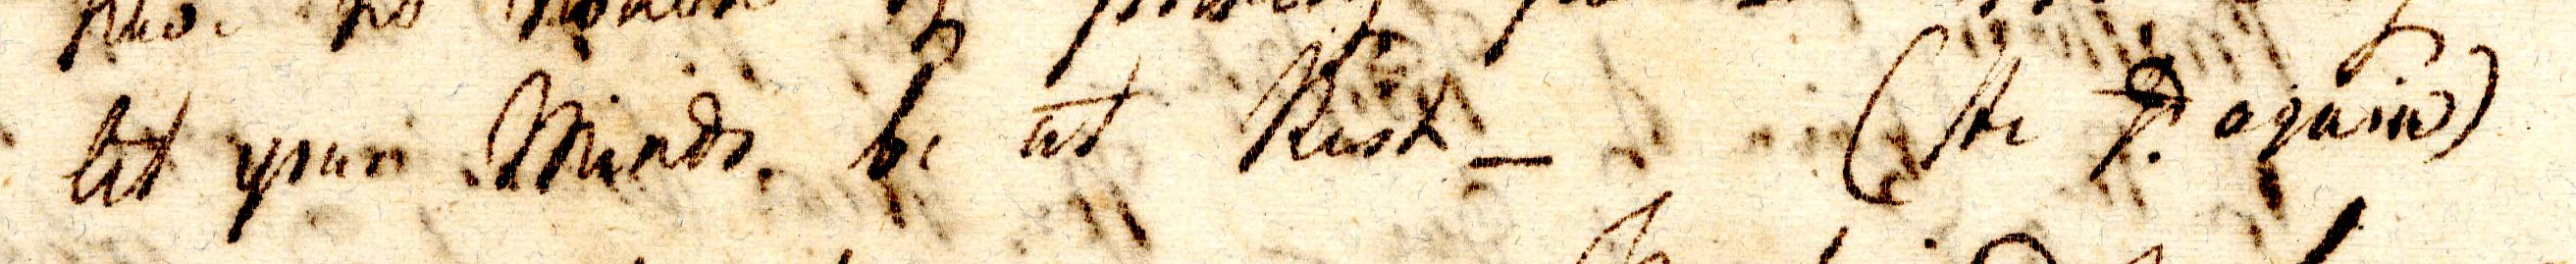let your Minds be at Rest- (He sd. again)
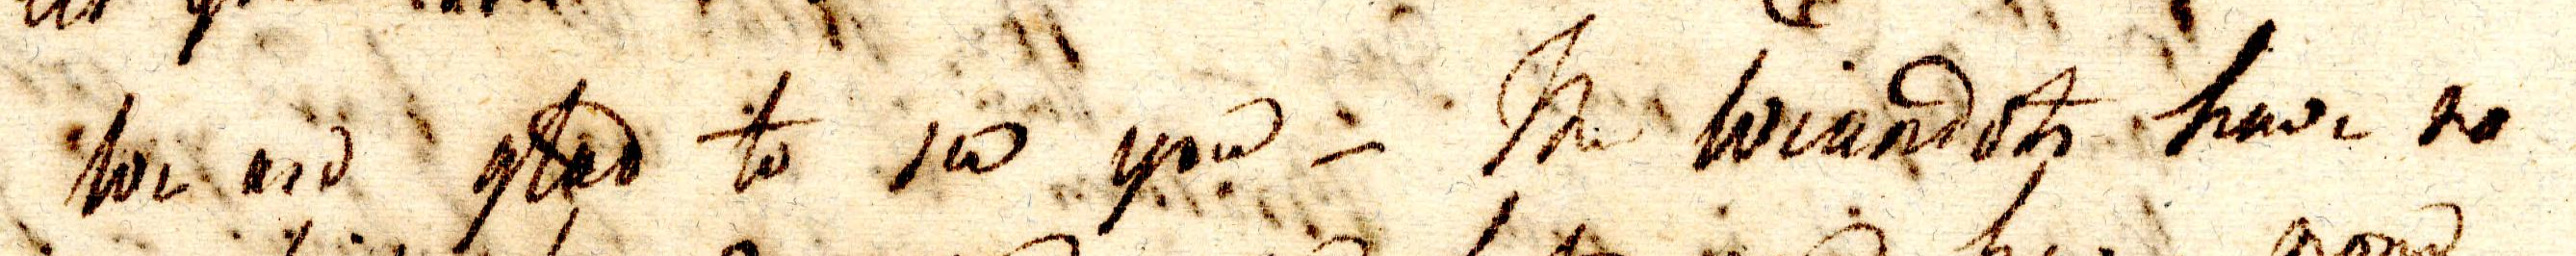we are glad to see you- The Wiandots have no
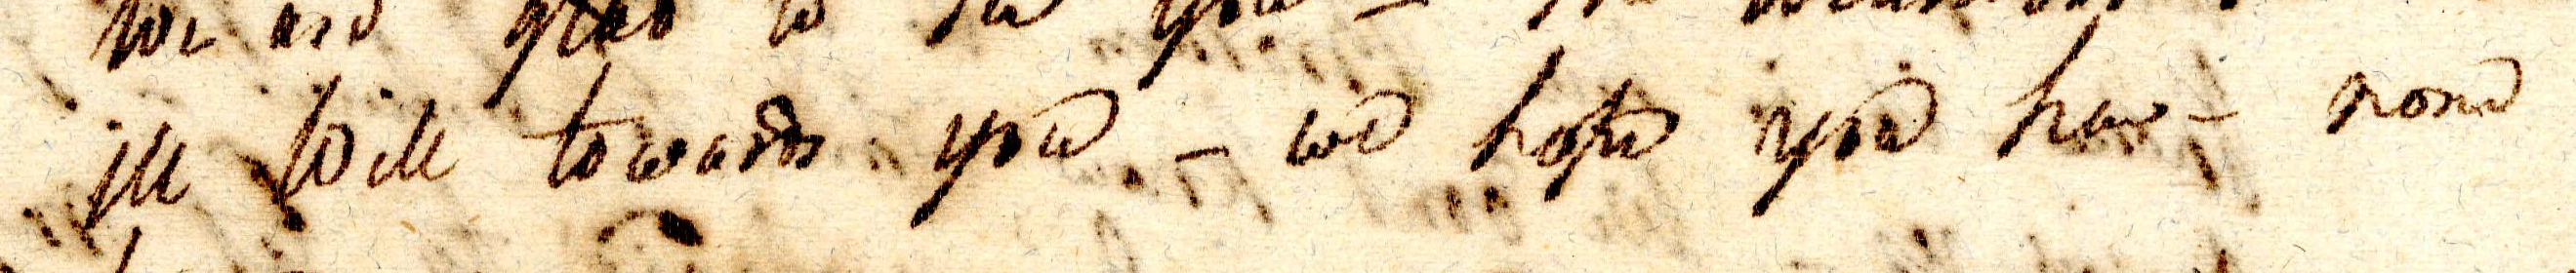ill will towards you- We hope you have none
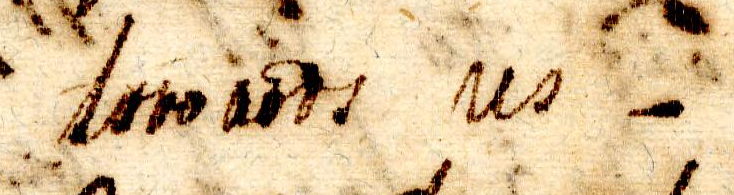towards us-
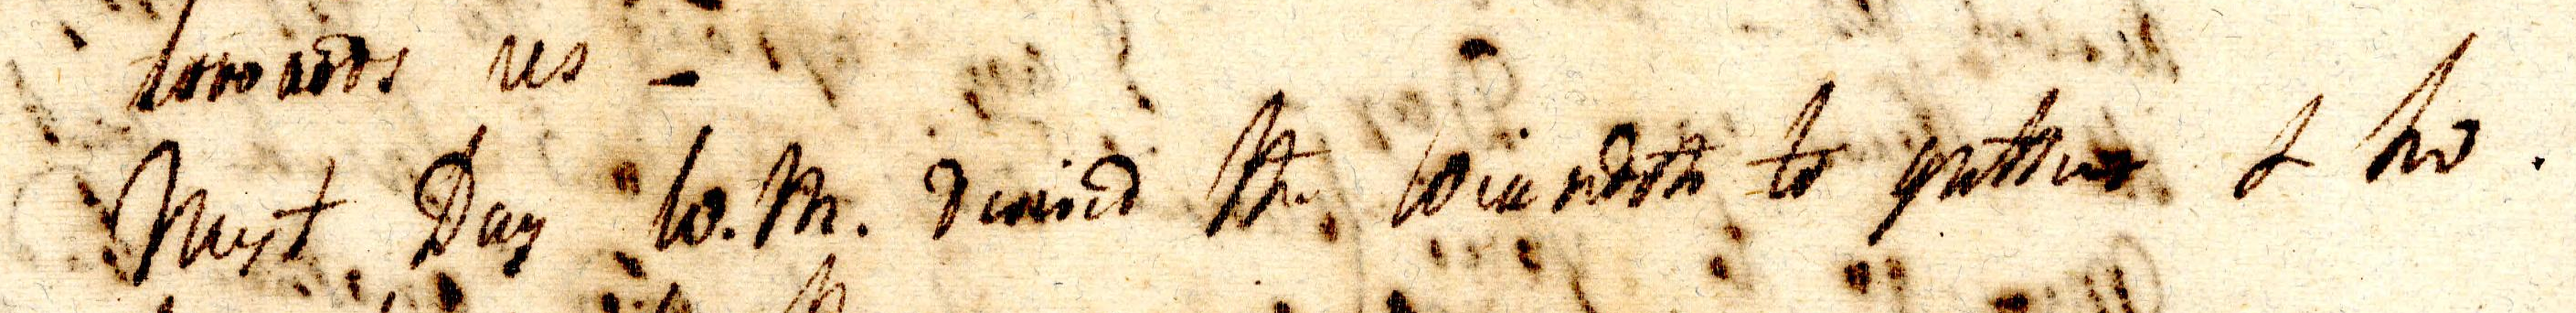Next Day W.M. desired the Wiandots to gather & he
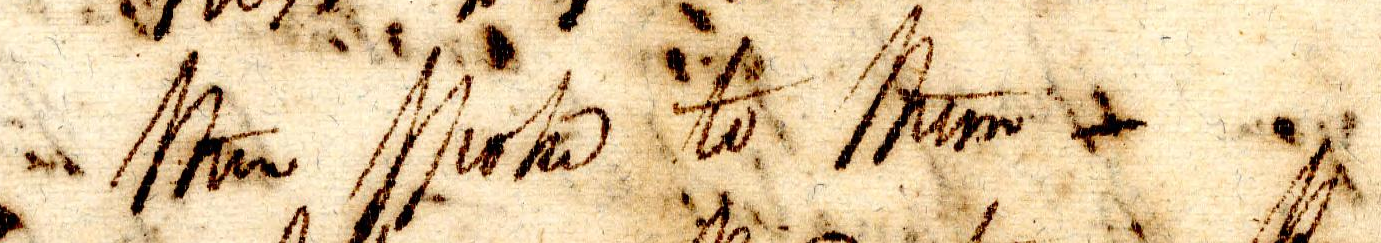there Spoke to them-.
